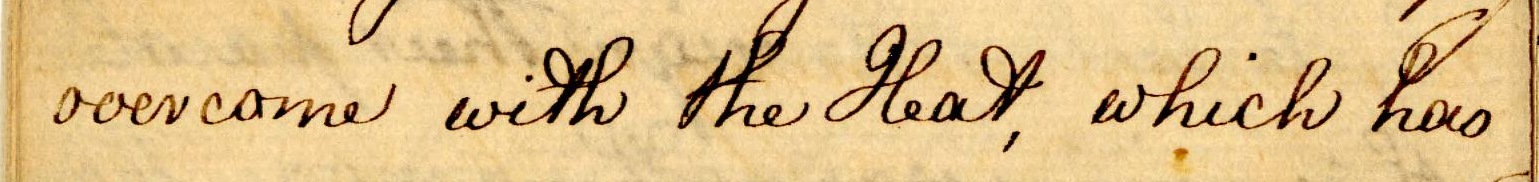overcame with the Heat, which has
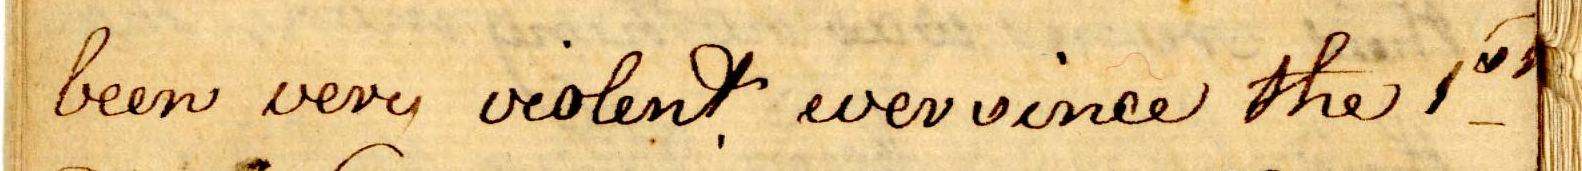been very violent, ever since the 1^st
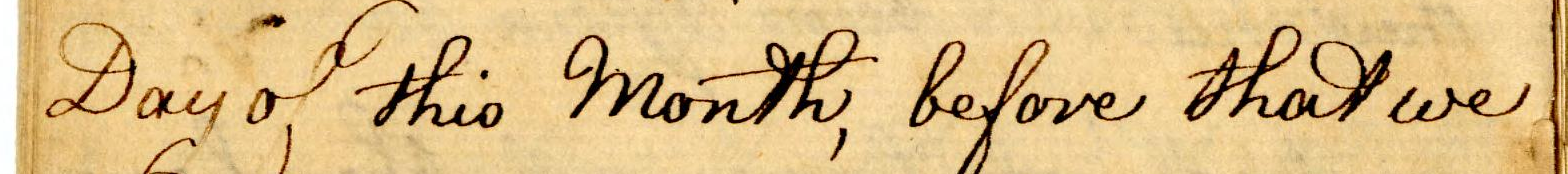Day of this Month, before that we
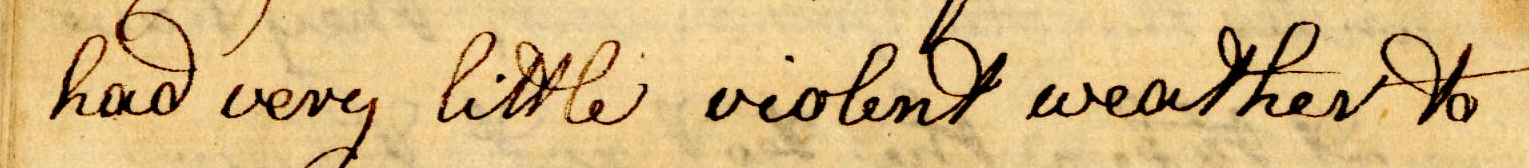had very little violent weather to
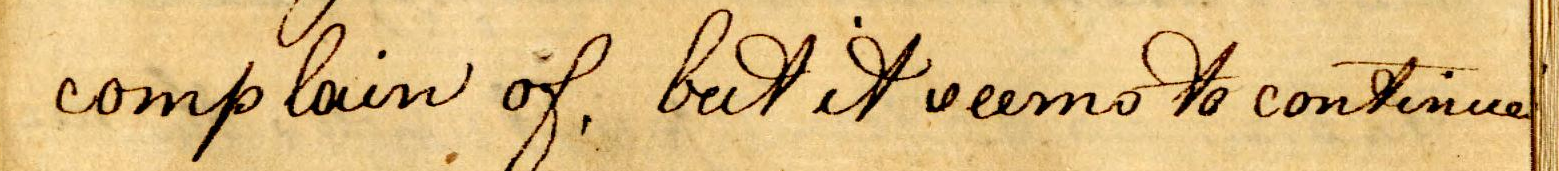complain of, but it seems to continue
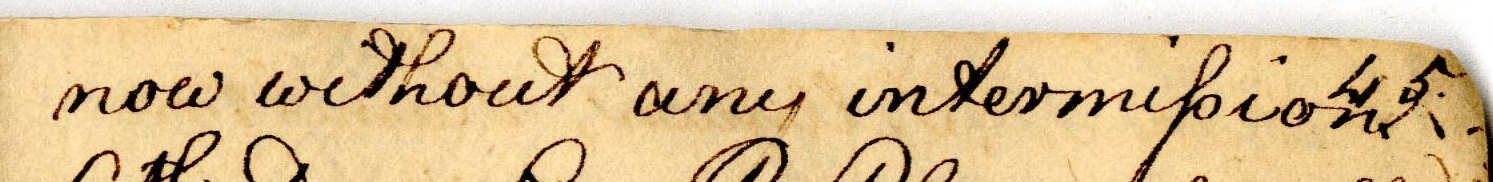now without any intermission
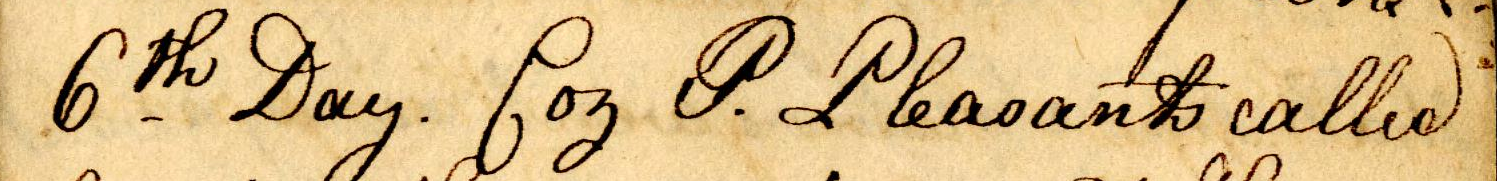6^th Day. Coz P. Pleasants called
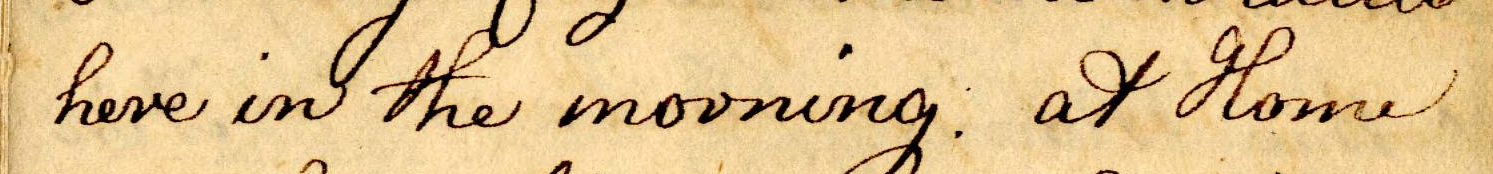here in the morning. at Home
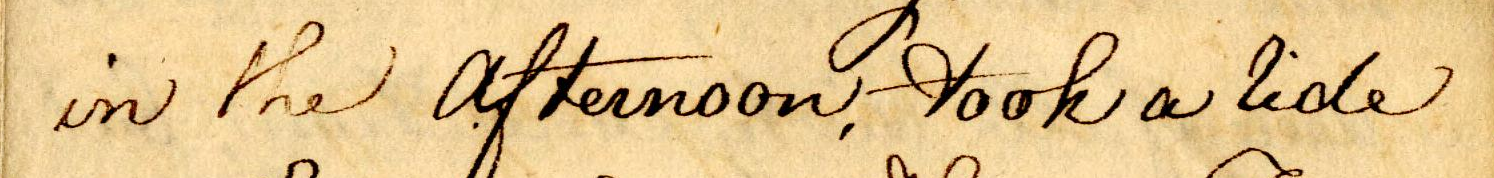in the Afternoon, took a ride
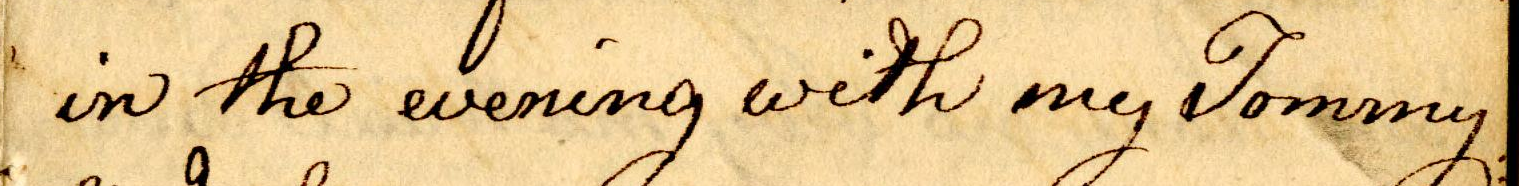in the evening with my Tommy
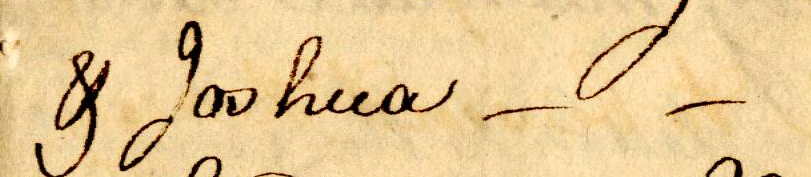& Joshua--
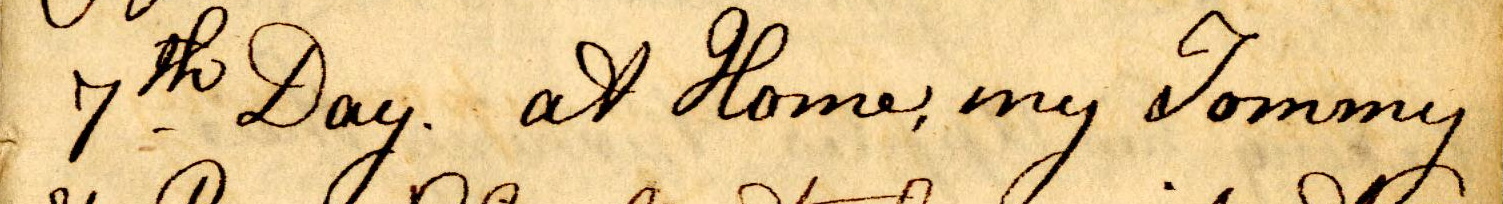7^th. Day. at Home, my Tommy
